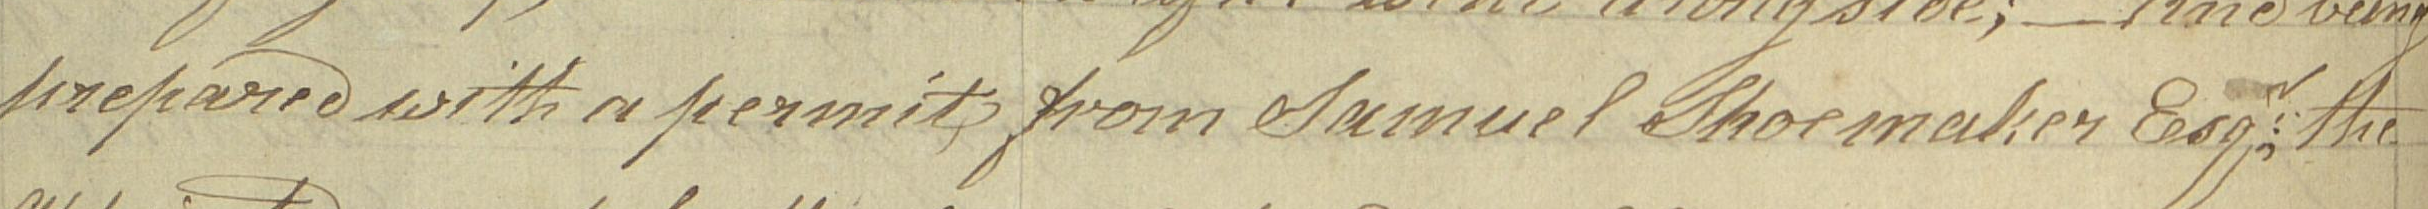prepared with a permit from Samuel Shoemaker Esq^r. the
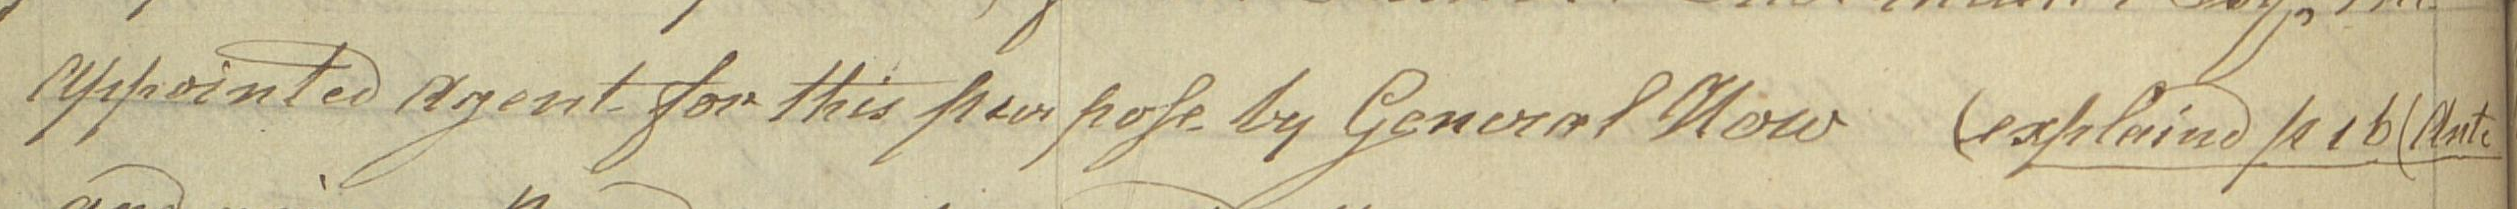appointed agent for this purpose by General How (explaind p e 6 (Ante
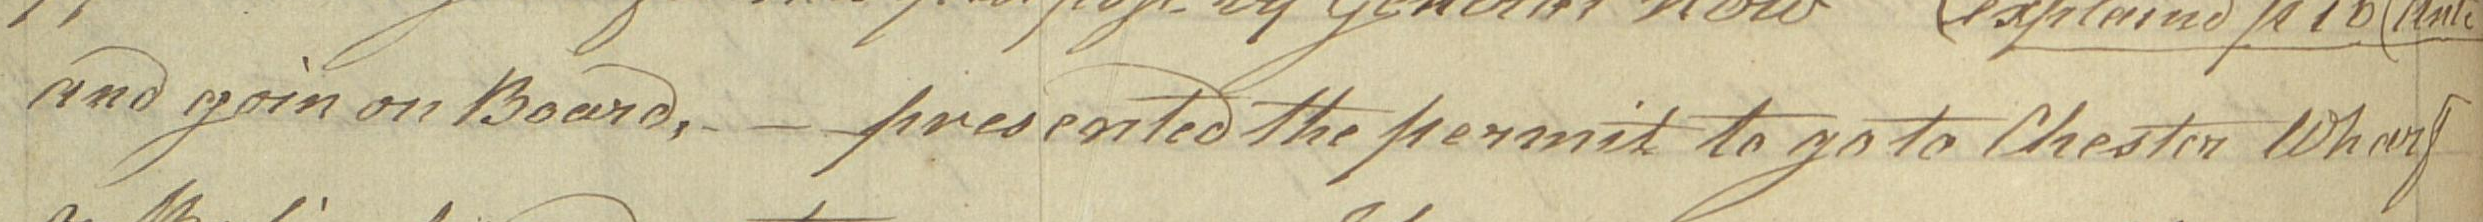and goin on Board, presenrted the permit to go to Chester Wharf
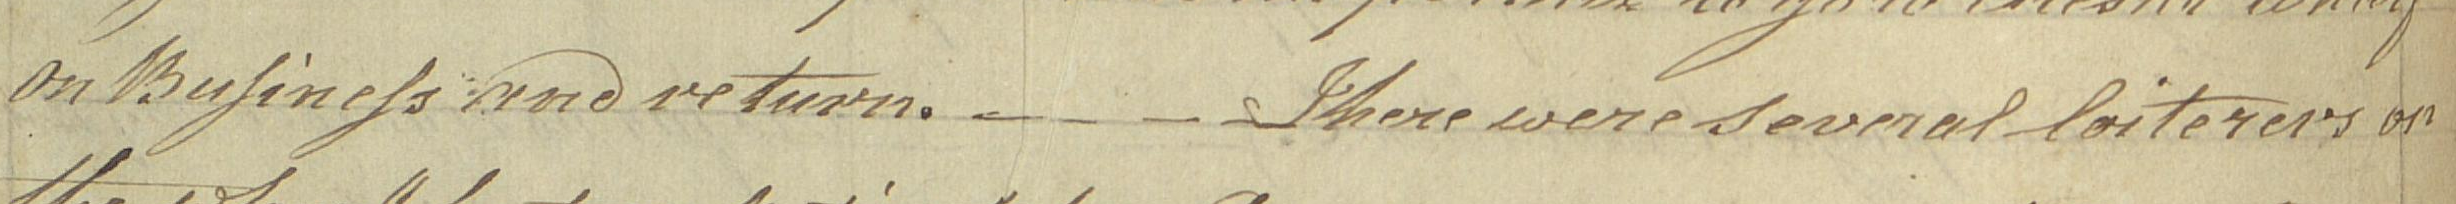on Business and return. There were several loiterers or
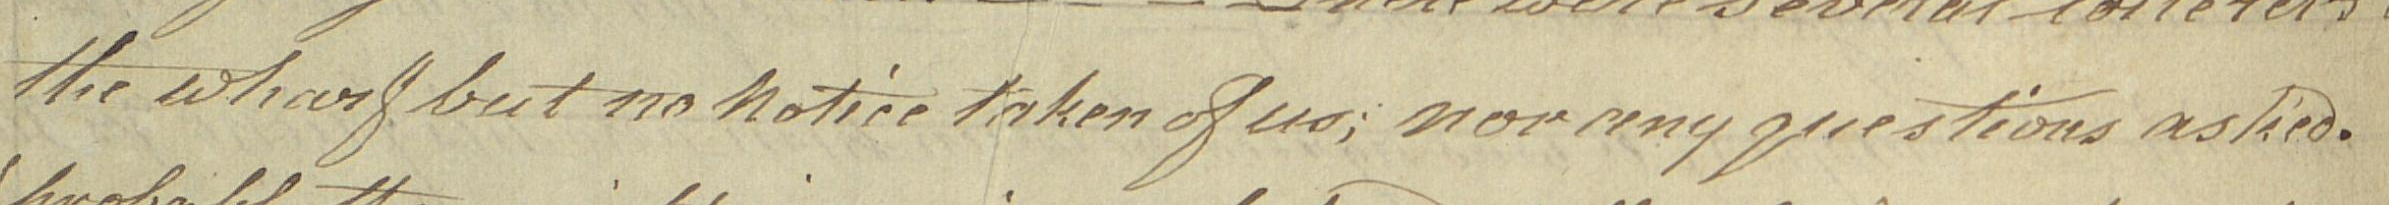the wharf but no Notice taken of us; nor my questions asked.
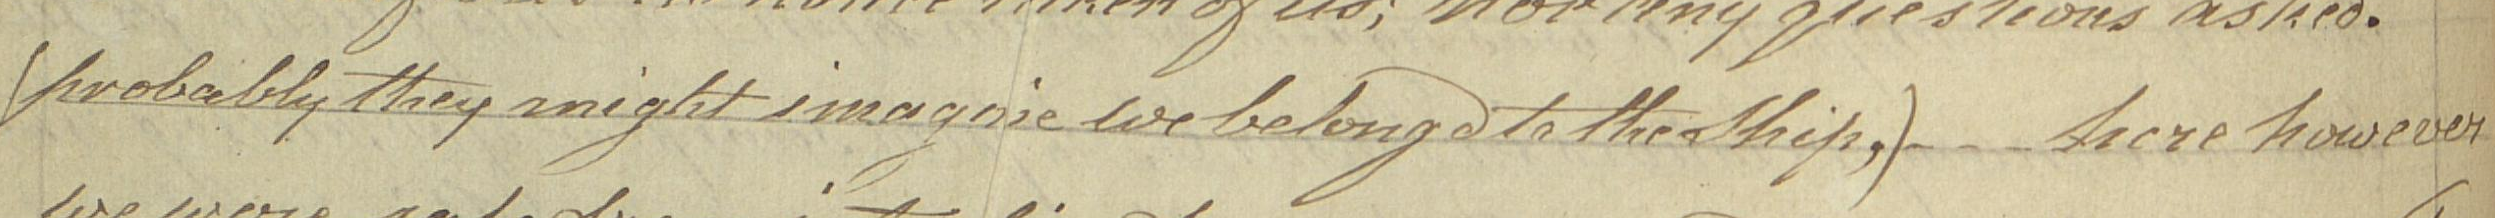(probably they might imagine we belongd to the Ship,) here however
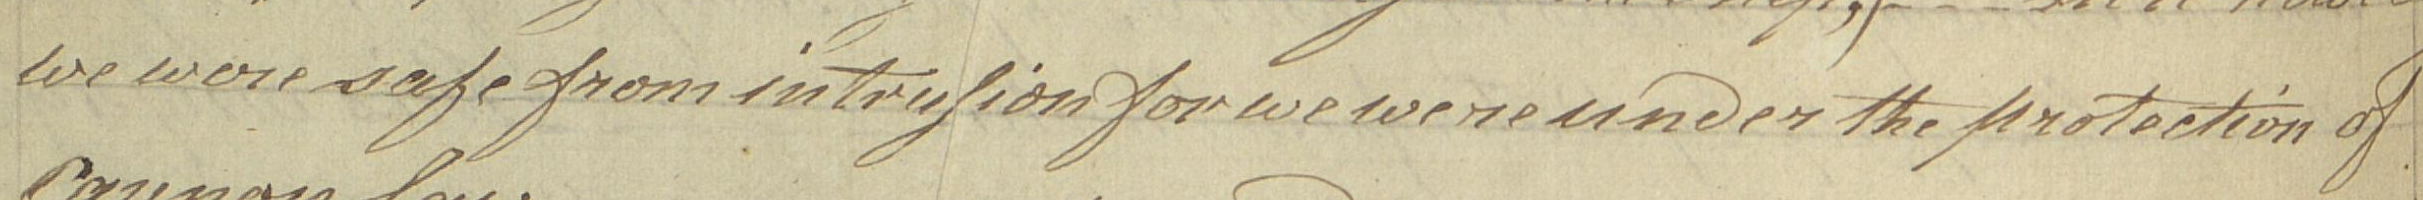we were safe from intrusion for we were under the protection of
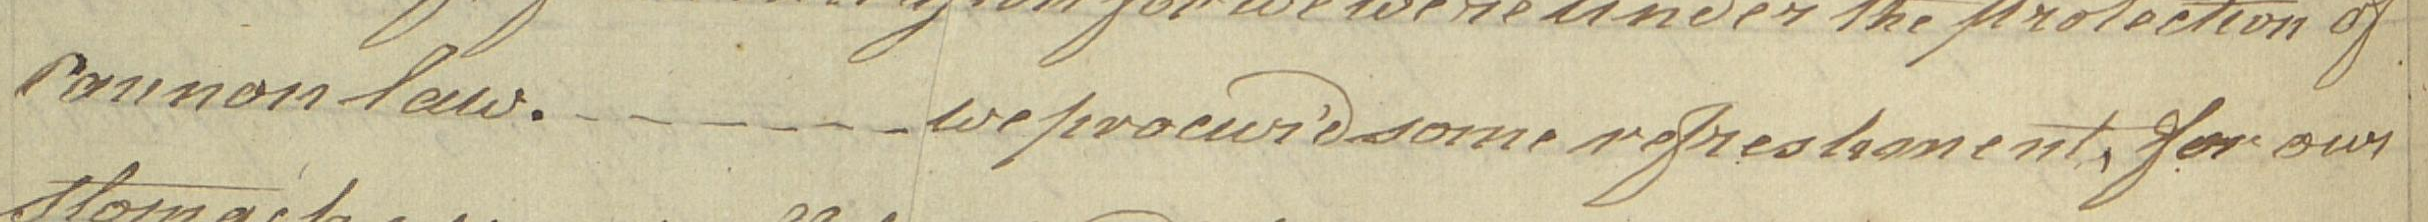Cannon law. We procur'd some refreshment, for our
